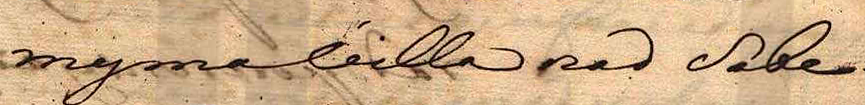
mesma villa naõ Sabe
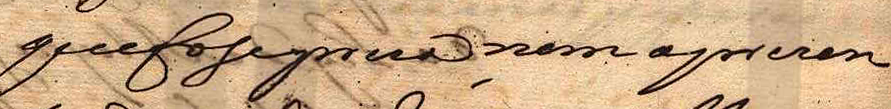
que fose preza, nem aprezen
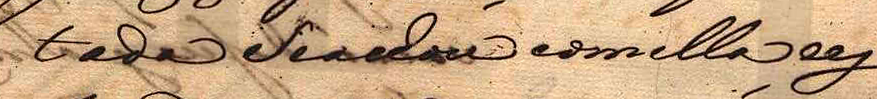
tada se achou com ella e es
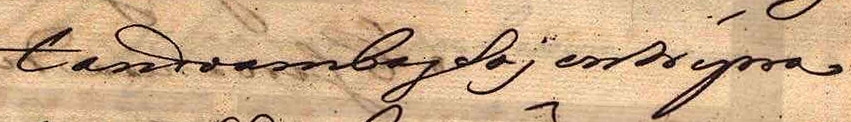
tando ambos sos entre pra
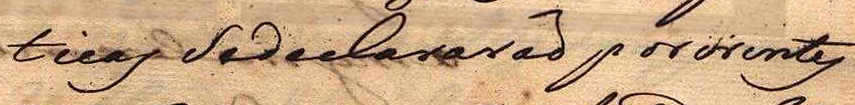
ticas se declararaõ por crentes
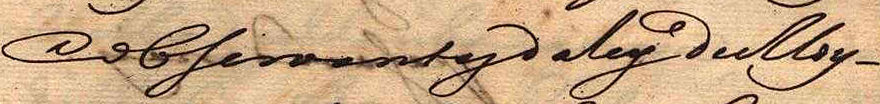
e observantes da ley de Moy
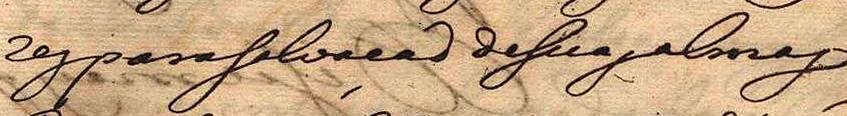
zes para salvaçaõ de suas almas
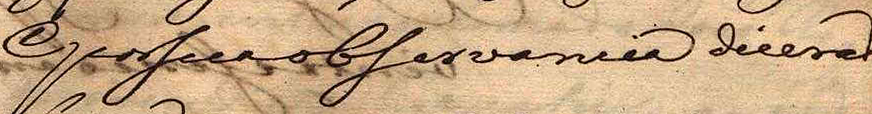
E por sua observancia diceraõ
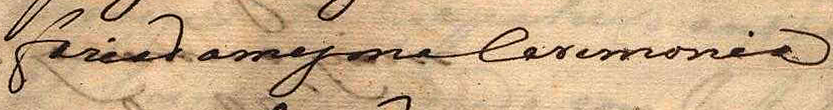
faziaõ a mesma Ceremonia
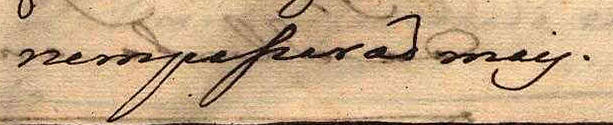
nem passaraõ mais.
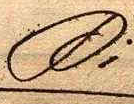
Di
